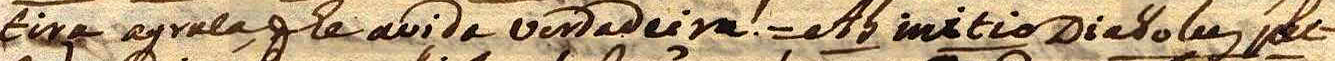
tira a graca, q̄ he a vida verdadeira .= Ab initio Diabolus pec
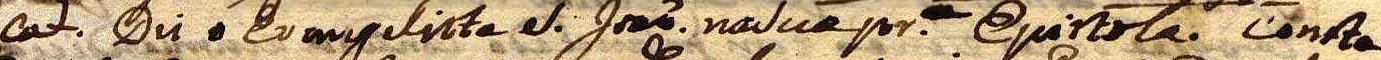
cat. Dei o Evangelista S. Joaõ. na sua pr.a Epistola. consta
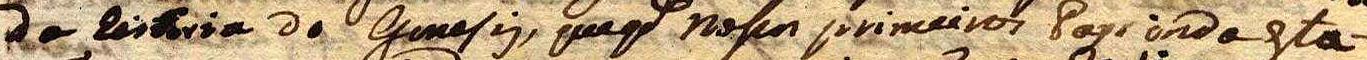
da historia do Genesis, que pro no seos primeiros Pays inda esta
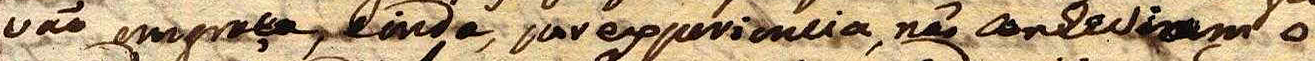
vão em graça, e inda, por experiencia, naõ conhesiam o
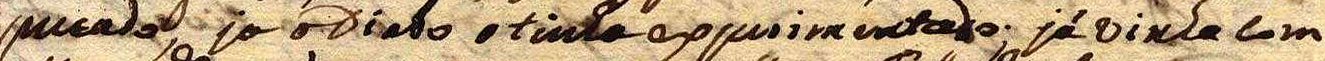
peccado, ja o Diabo o tinha experimentado; já vinha com
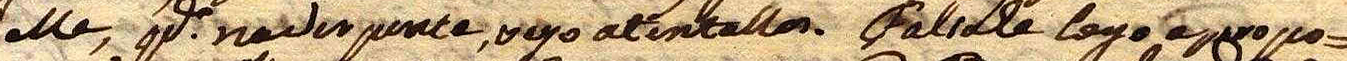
elle, qd.o na serpente, veyo a tentallos. Falso he Logo a propo
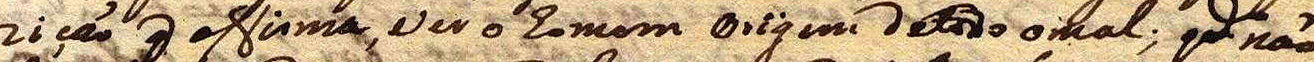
ziçaõ q̄ affirma, ser o homem origem de todo o mal; qdo naõ
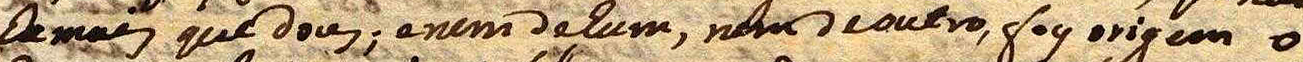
he mais que dous; e nem de hum, nem de outro, foy origem o
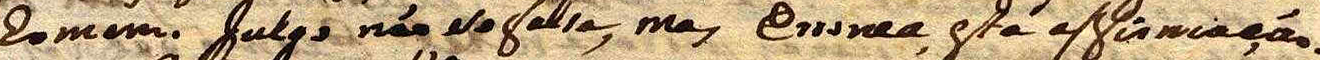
homem. Julgo não so falsa, mas Erronea, esta affirmação.
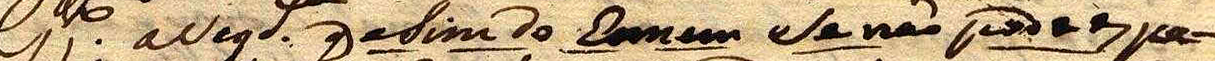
Q.to a segd.a q̄ aSim do homem se naõ pode espe
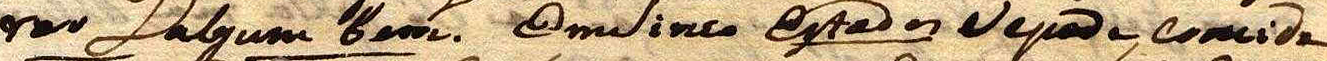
rar algum bem. Em sinco Estados se pode, concide
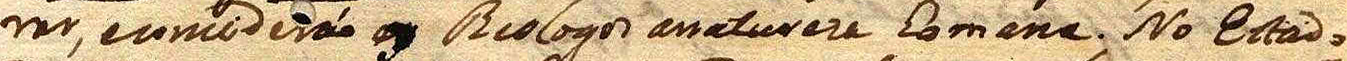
rar, e conciderão os Theologos a natureza homana No Estado
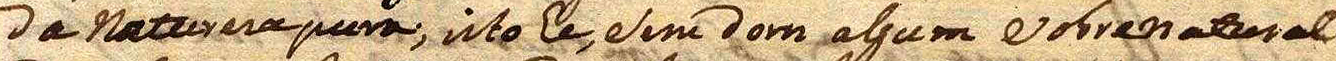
da natureza pura; isto hé, sem dom algum sobrenatural.
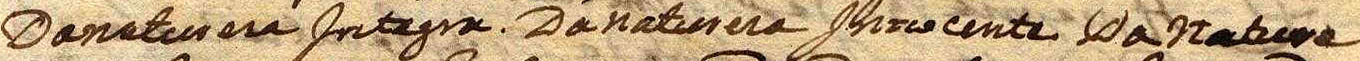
Da natureza Jntegra. Da natureza Jnnocente Da nature
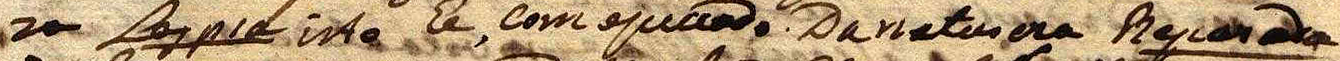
za Laspsa isto he, com o peccado. Da natureza Reparada
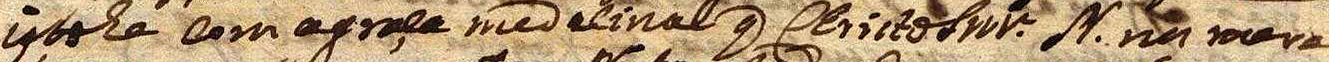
isto he com a graça medecinal q̄ Christo Snr̄. N. nos mere
